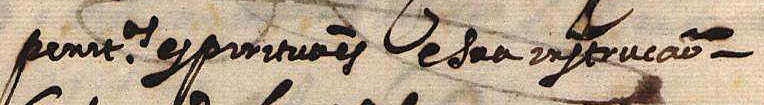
penit.as espirituaēs e sua instruçaõ -
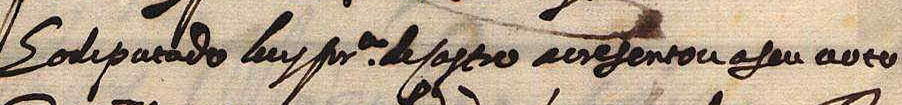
E o deputado luis pr.a de Castro acresentou a seu uoto
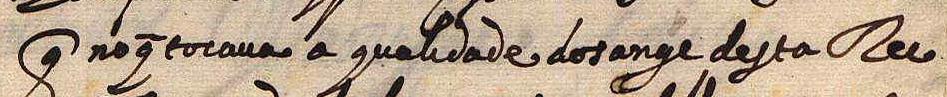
q̄ no q̄ tocaua a qualidade do sange desta Ree
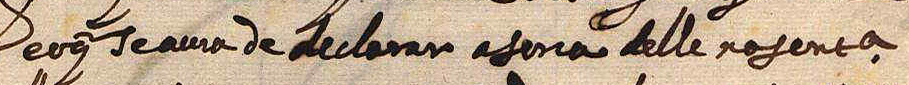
e o q̄ se auia de declarar aserca delle na sent.a
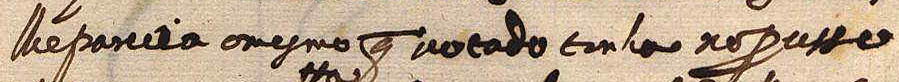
lhe parecia o mesmo q̄ uotado tinha no ꝓcesso
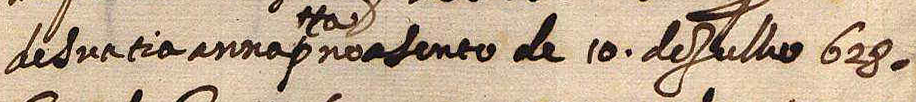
de sua tia anna pta no asento de 10. de Julho 628.
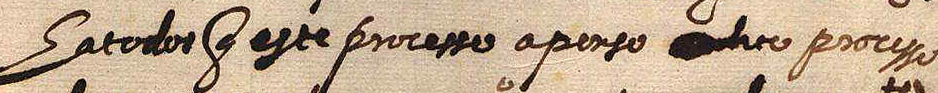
E a todos q̄ este processo apenso _ dito processo
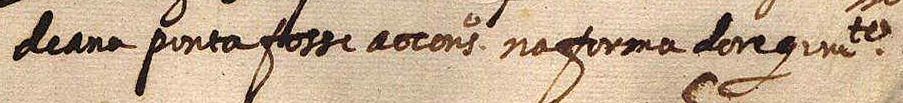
de ana pinta fosse ao cons.o na forma do regimto.
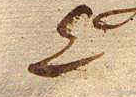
E
